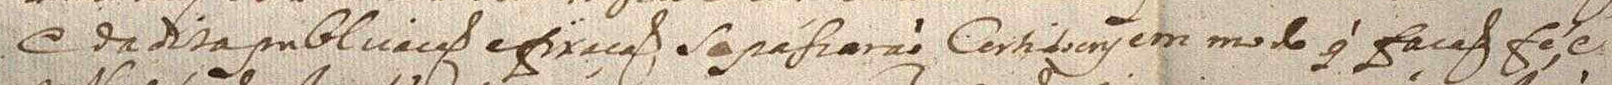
E da dita publicaçaõ e fixaçaõ se passaraõ Certidoens em modo q̄ façaõ fé, e
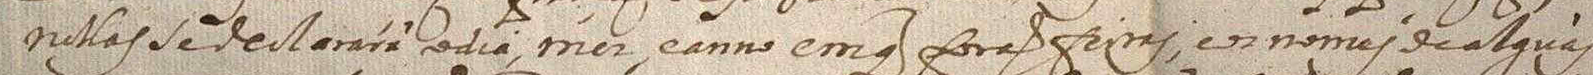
nellas se declarará o dia, mez, e anno em q̄ foraõ feitas, e os nomes de alguās
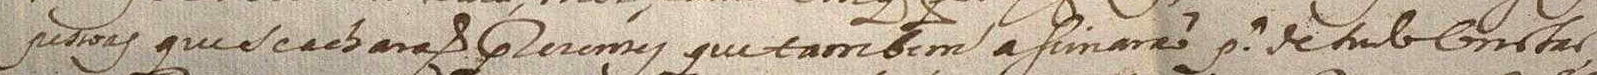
pessoas que se acharaõ prezentes que tambem assinaraõ p.a de tudo constar
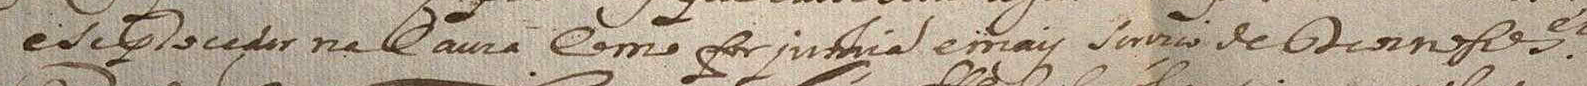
e se pRoceder na Cauza Como for justiça e mais serviço de Deos nosso s.or
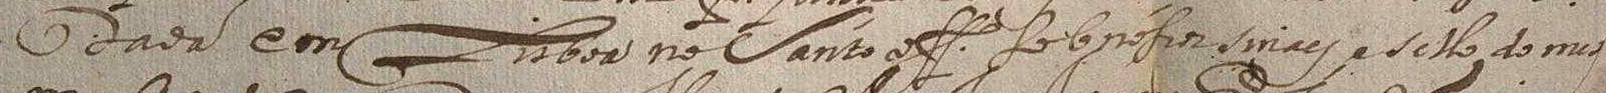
dada em Lisboa no Santo off.o sob nossos sinaes, e sello do mes
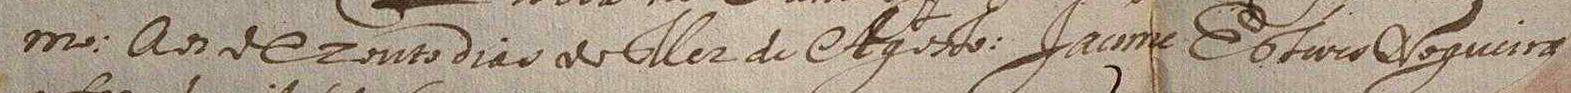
mo: Aos dezouto dias do Mez de Agosto: Jacome Esteves Nogueira
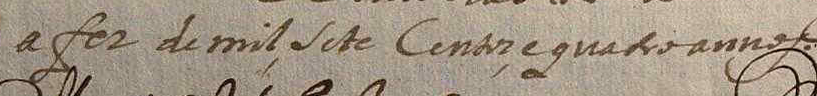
a fez de mil seteCentos, e quatro annos
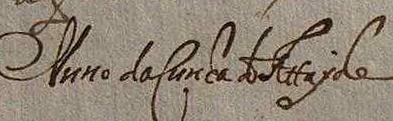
Nuno da Cunha d̄ Attayde
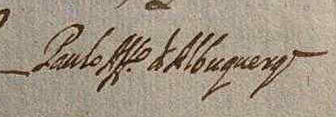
Paulo Aff.o d̄ Albuquerq̄
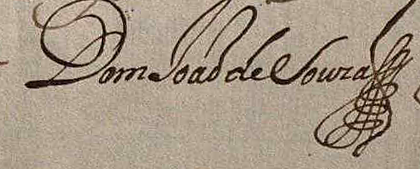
Dom Ioaõ de Souza
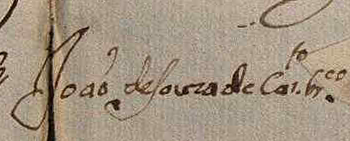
Joaõ de souza de Cas.to br.co
